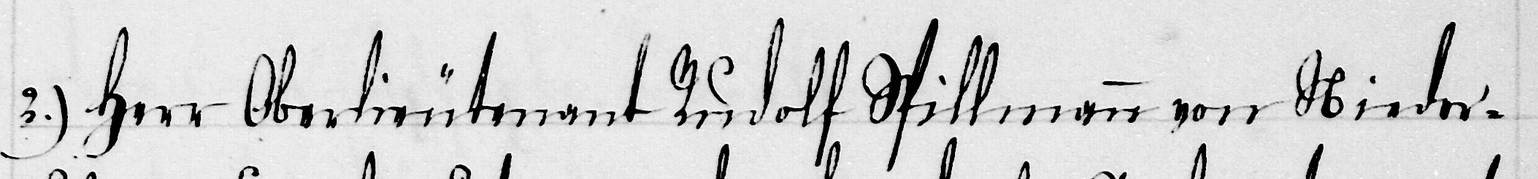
2.) Herr Oberlieutenant Rudolf Spillmann von Nieder-U¬
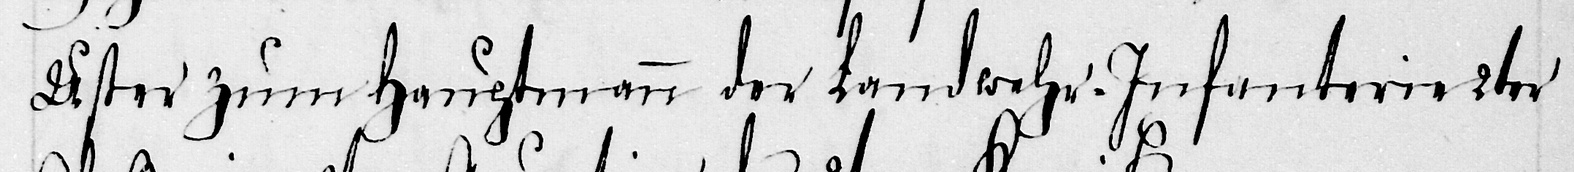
ster zum Hauptmann der Landwehr-Infanterie 2ter
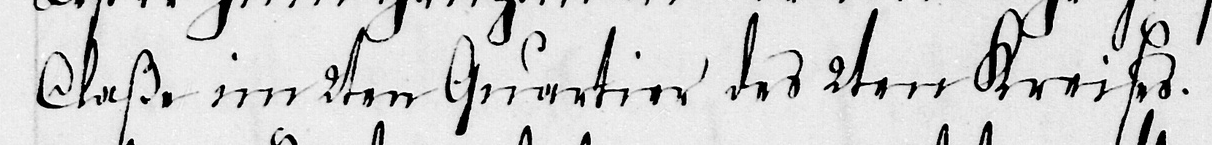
Claße im 2ten Quartier des 2ten Kreises.
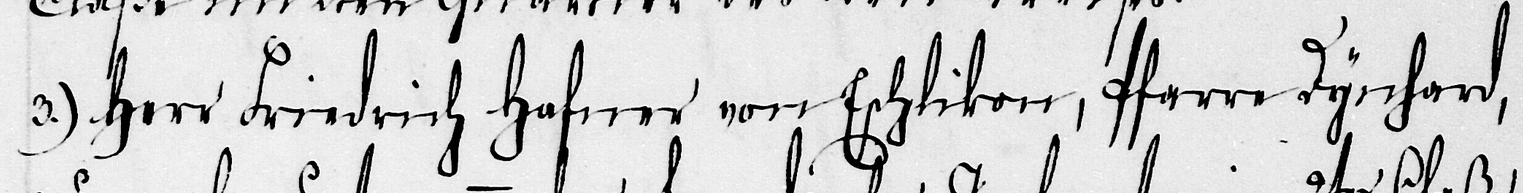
3.) Herr Friedrich Hafner von Eschlikon, Pfarre Dynhard,
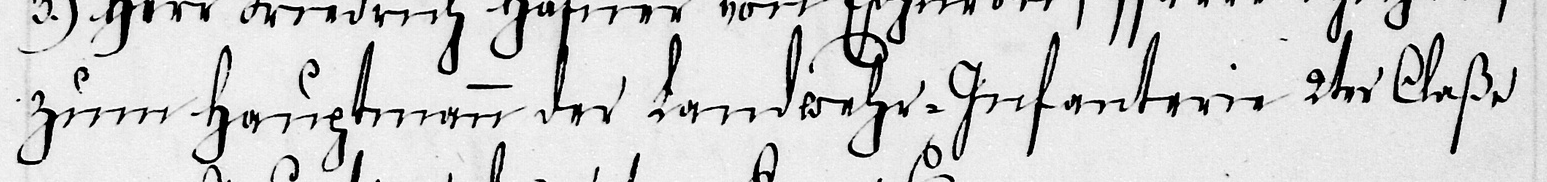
zum Hauptmann der Landwehr-Infanterie 2ter Claße
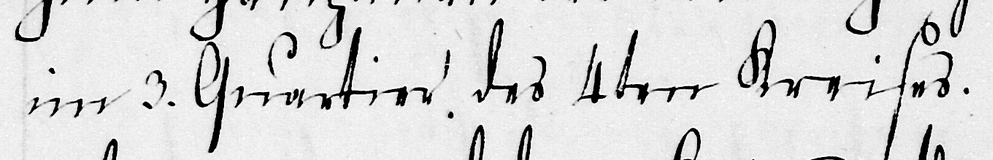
im 3. Quartier des 4ten Kreises.
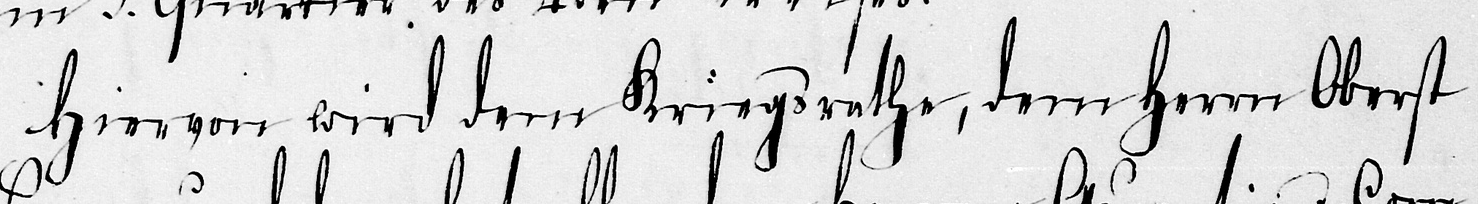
Hiervon wird dem Kriegsrathe, dem Herrn Oberst
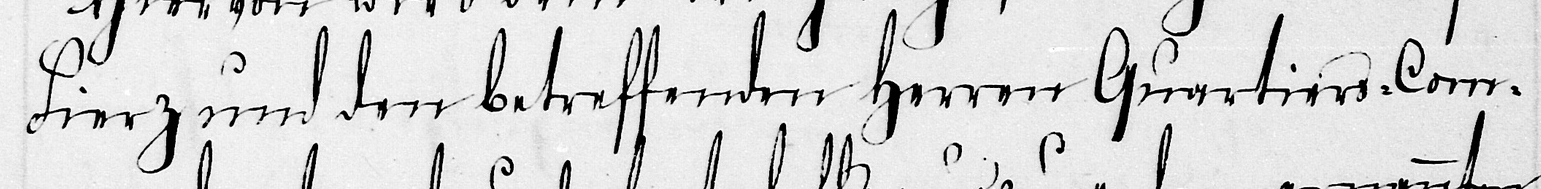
Fierz und den betreffenden Herren Quartiers-Com¬
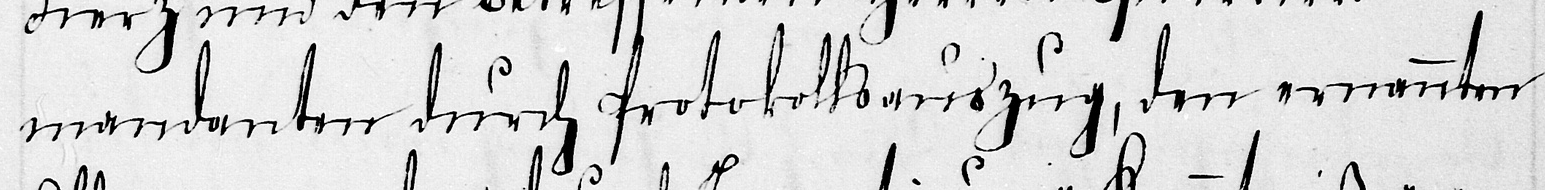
mandanten durch Protokollsauszug, den ernannten
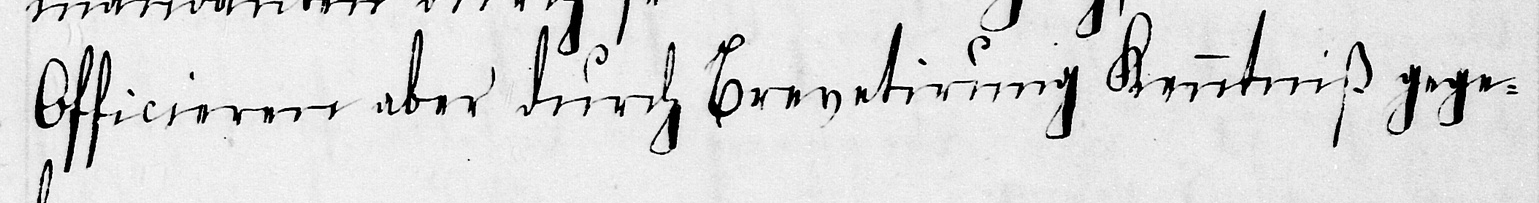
Officieren aber durch Brevetirung Kenntniß gege¬
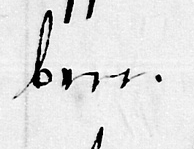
ben.
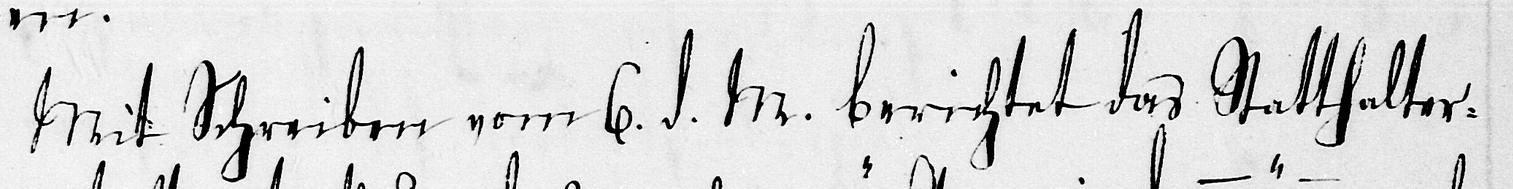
Mit Schreiben vom 6. d. M. berichtet das Statthalter¬
